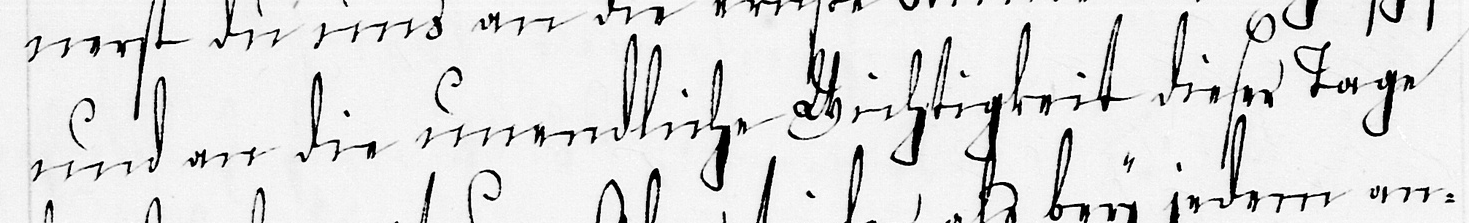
und an die unendliche Wichtigkeit dieser Tage
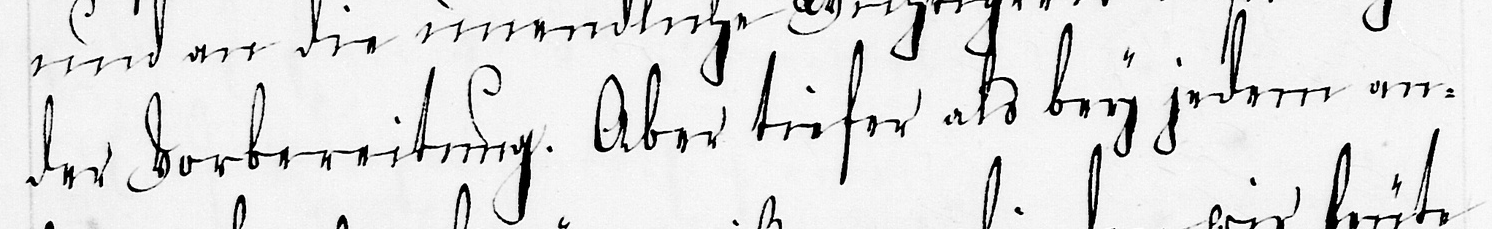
der Vorbereitung. Aber tiefer als bey jedem an¬
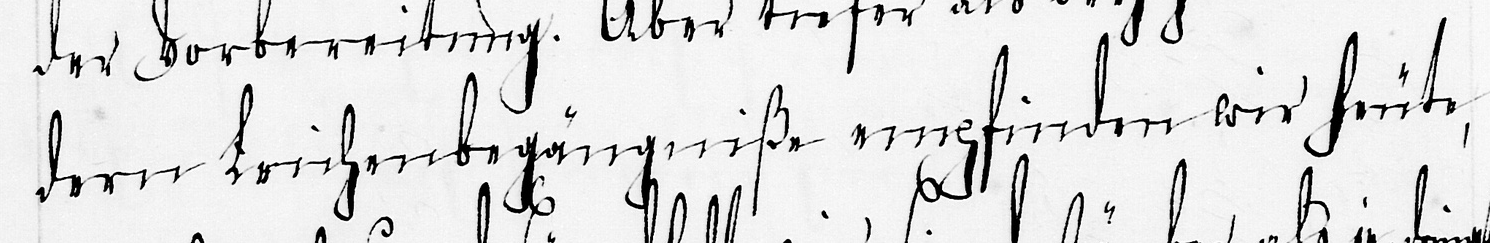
dern Leichenbegängniße empfinden wir heute,
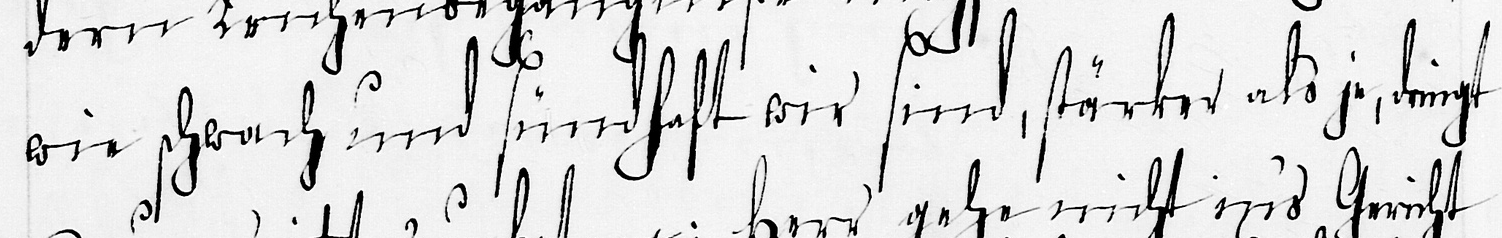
wie schwach und sündhaft wir sind, stärker als je,
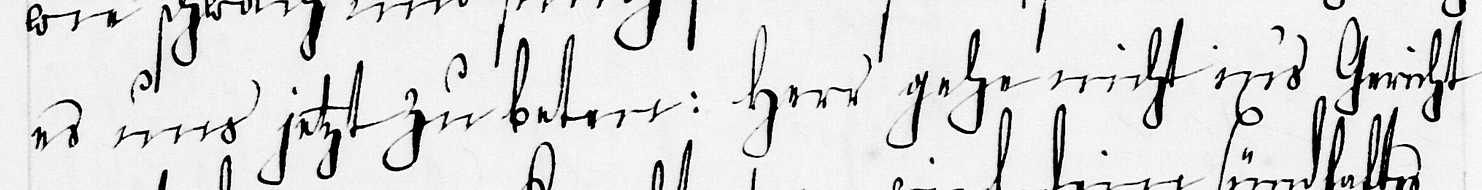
es uns jetzt zu beten: Herr gehe nicht in’s Gericht
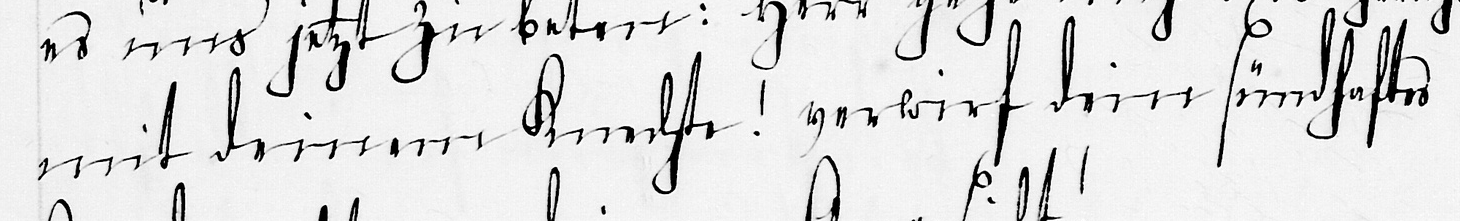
mit deinem Knechte! verwirf dein sündhaftes
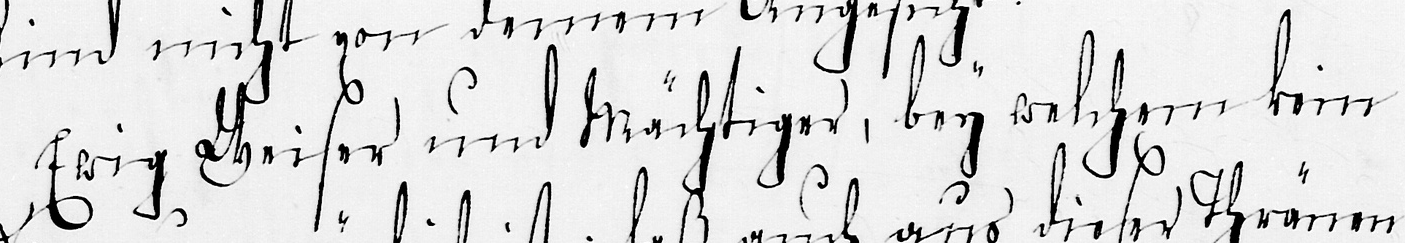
Ewig Weiser und Mächtiger, bey welchem kein
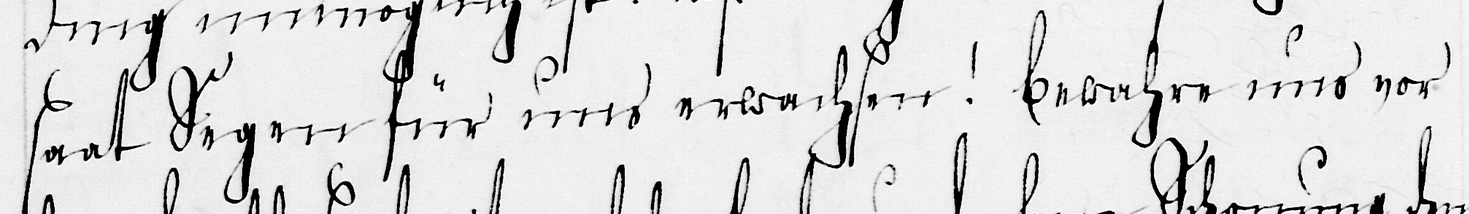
saat Segen für uns erwachsen! Bewahre uns vor
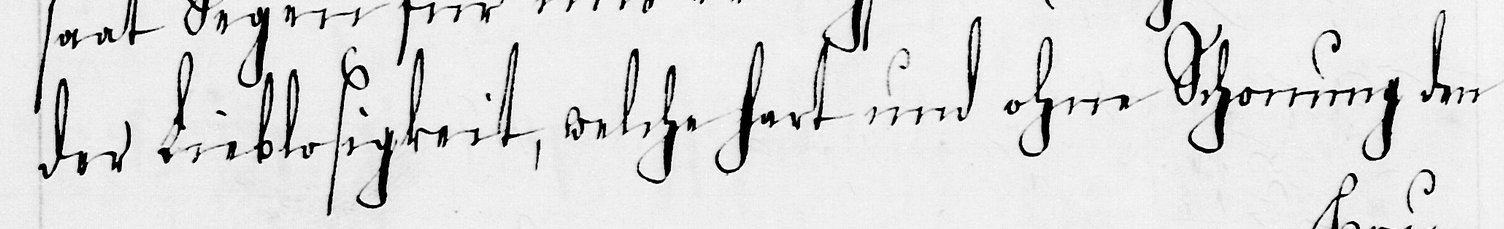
der Lieblosigkeit, welche hart und ohne Schonung den
